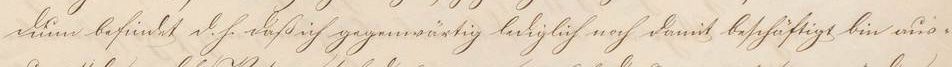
dium befindet d. h. daß ich gegenwärtig lediglich noch damit beschäftigt bin aus-
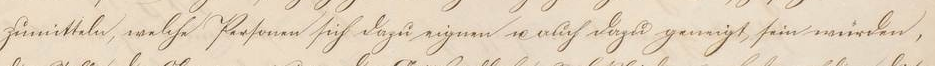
zumitteln, welche Personen sich dazu eignen & auch dazu geneigt sein würden,
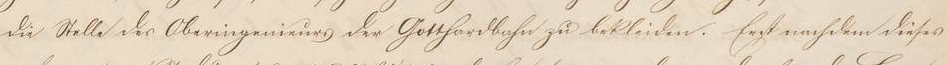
die Stelle des Oberingenieurs der Gotthardbahn zu bekleiden. Erst nachdem dieses
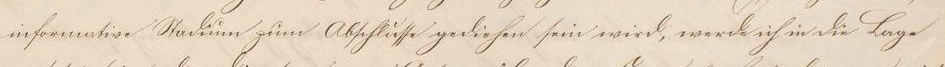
informative Stadium zum Abschlusse gediehen sein wird, werde ich in die Lage
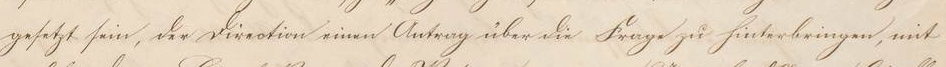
gesetzt sein, der Direction einen Antrag über die Frage zu hinterbringen, mit
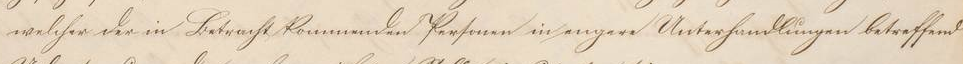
welcher der in Betracht kommenden Personen in engere Unterhandlungen betreffend
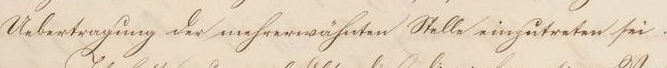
Uebertragung der mehrerwähnten Stelle einzutreten sei.
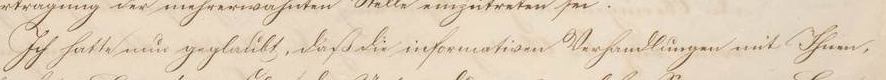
Ich hatte nun geglaubt, daß die informativen Verhandlungen mit Ihnen,
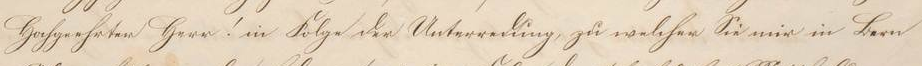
Hochgeehrter Herr! in Folge der Unterredung, zu welcher Sie mir in Bern
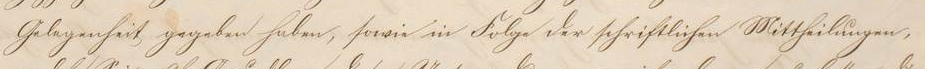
Gelegenheit gegeben haben, sowie in Folge der schriftlichen Mittheilungen,
